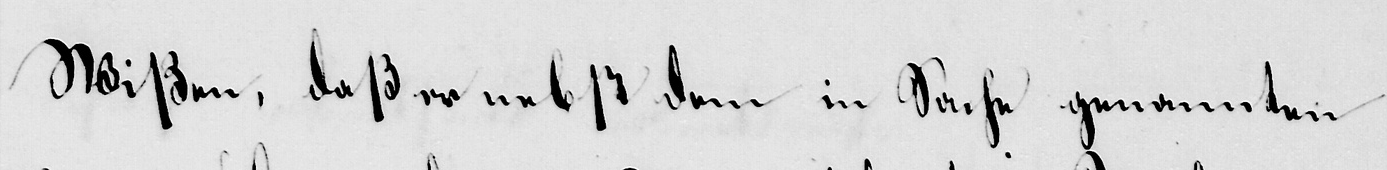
Wißen, daß er nebst dem in Sache genannten
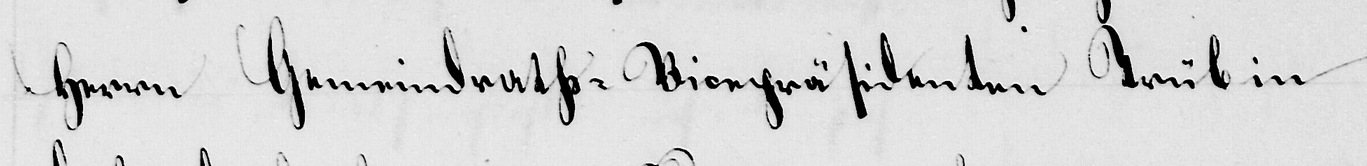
Herrn Gemeindrathe Vicepräsidenten Trüb in
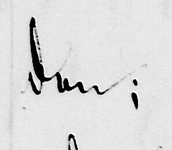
den;
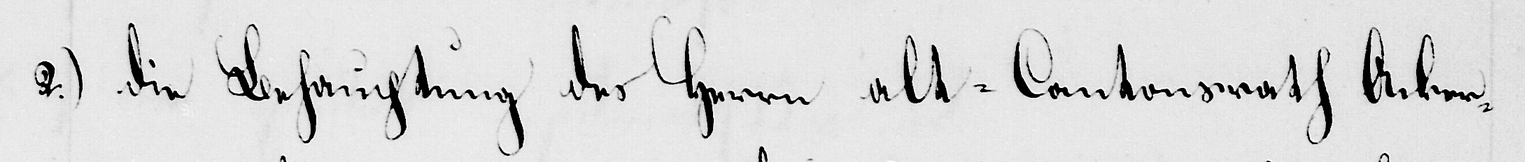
2.) Die Behauptung des Herrn alt-Cantonsrath Acker¬
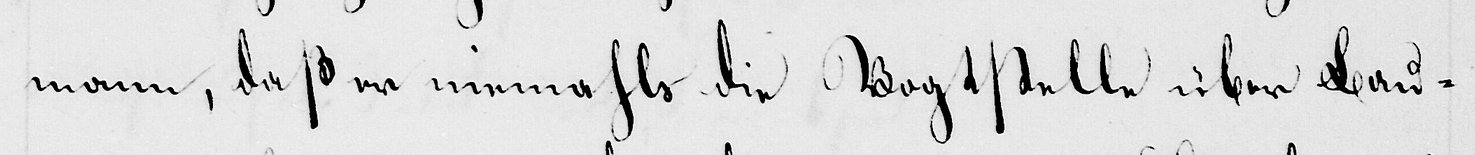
mann, daß er niemahls die Vogtstelle über Bau¬
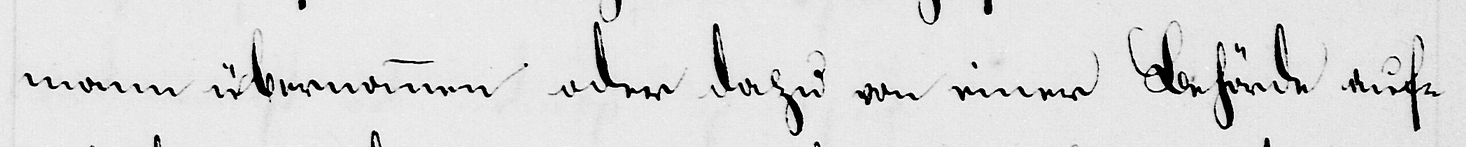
mann übernommen oder dazu von einer Behörde auf¬
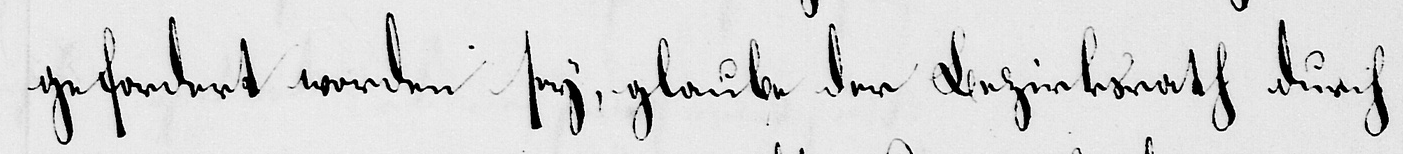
gefordert worden sey, glaube der Bezirksrath durch
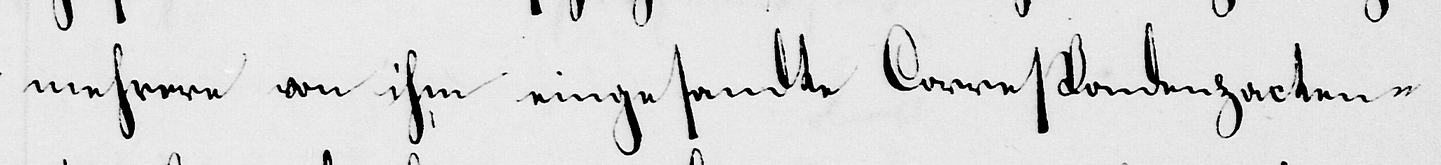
mehrere von ihm eingesandte Correspondenzacten¬
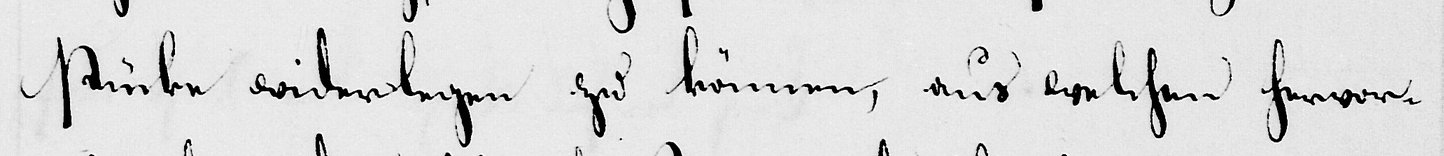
stücke widerlegen zu können, aus welchen hervor¬
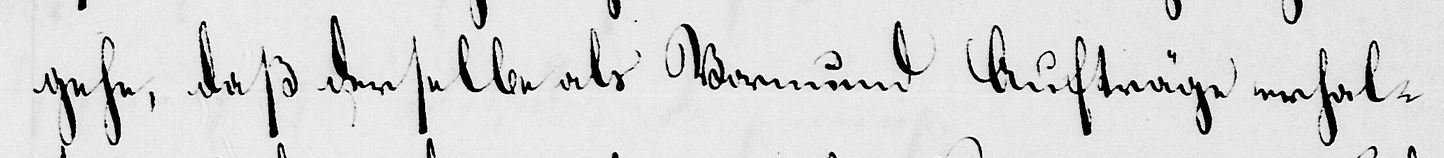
gehe, daß derselbe als Vormund Aufträge erhal¬
